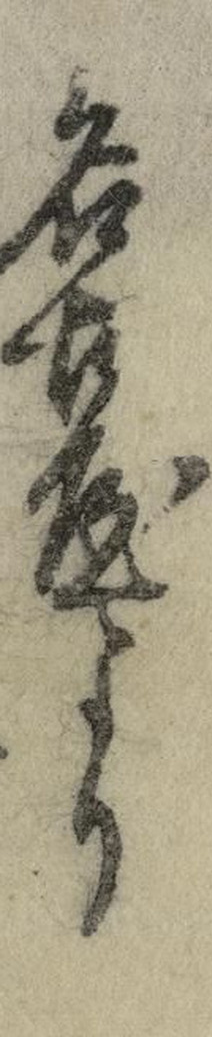名古屋より
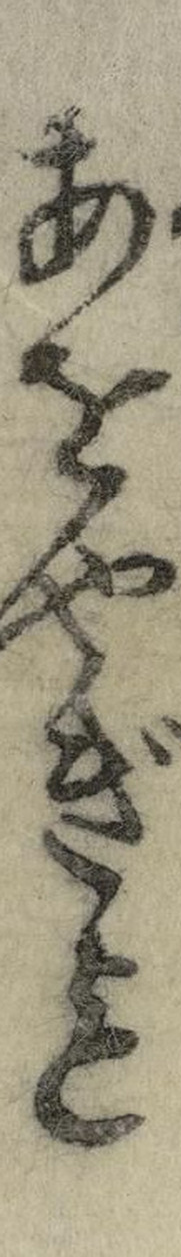あをやぎ迄
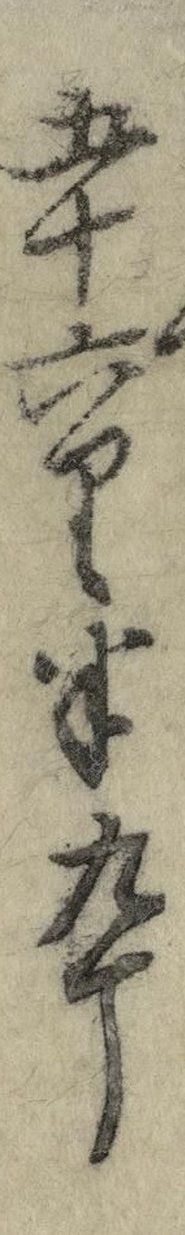五十六里半九丁
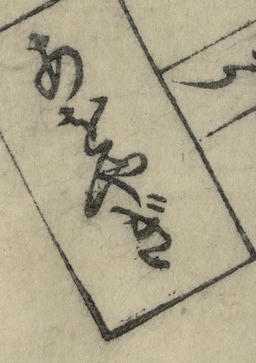あをやぎ
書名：[善光寺地震に関する瓦版]
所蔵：東京大学地震研究所図書室 Earthquake Research Institute Library, The University of Tokyo, JAPAN
